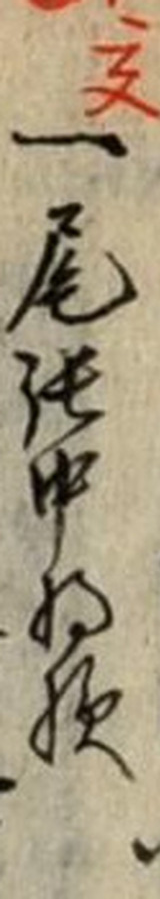一尾張中将様
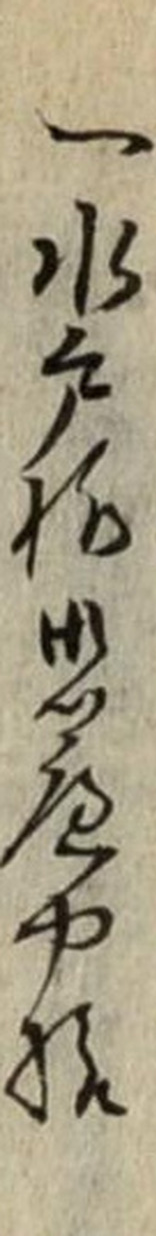一水戸様御簾中様
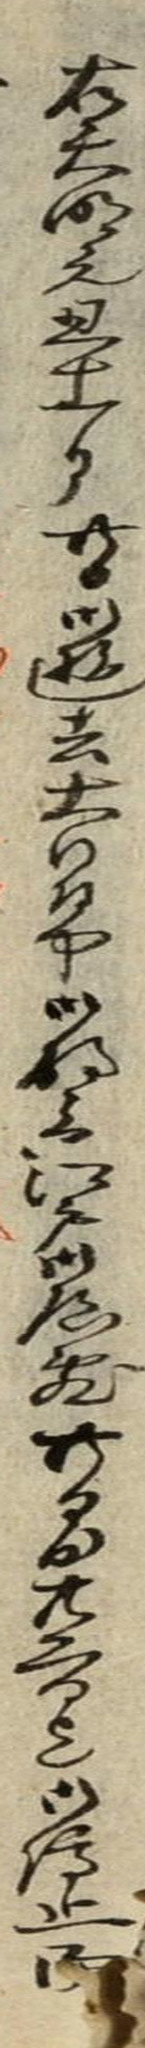右天明元丑十一月廿日御逝去大目付中御触にて江戸御屋敷廿日ゟ廿二日迄御停止御
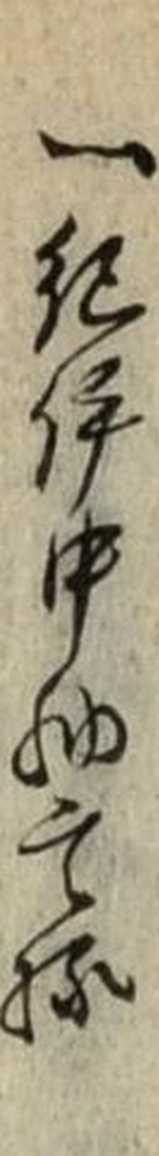一紀伊中納言様
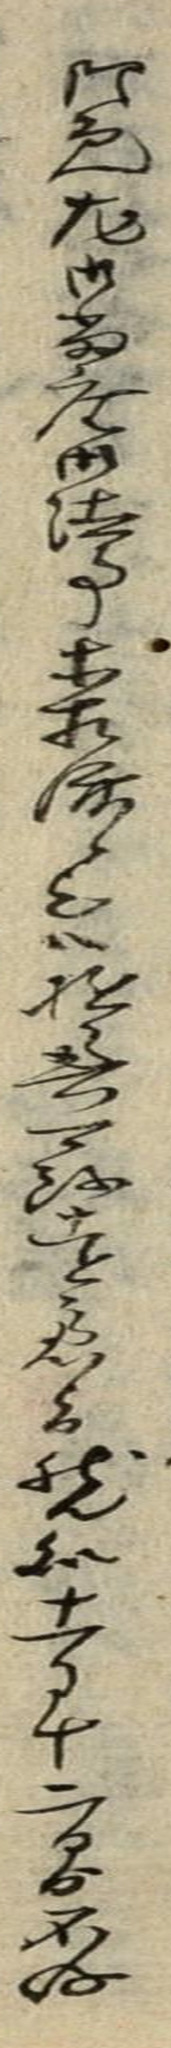御免尤御当座御法事等相済候迄は遊興可致遠慮旨然ル処十一月十二日ゟ不及
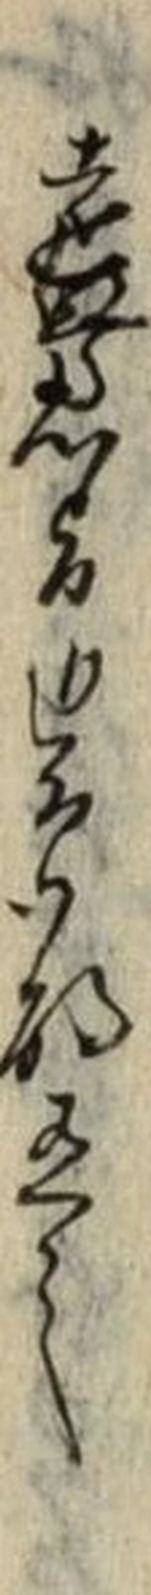遠慮旨追て御触有之
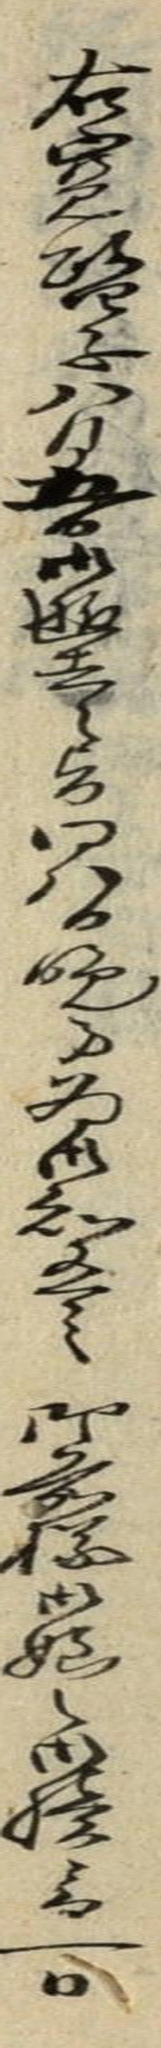右寛政四子八月五日御逝去之旨同八日晩方為御知有之御前様御姫之御続にて一日
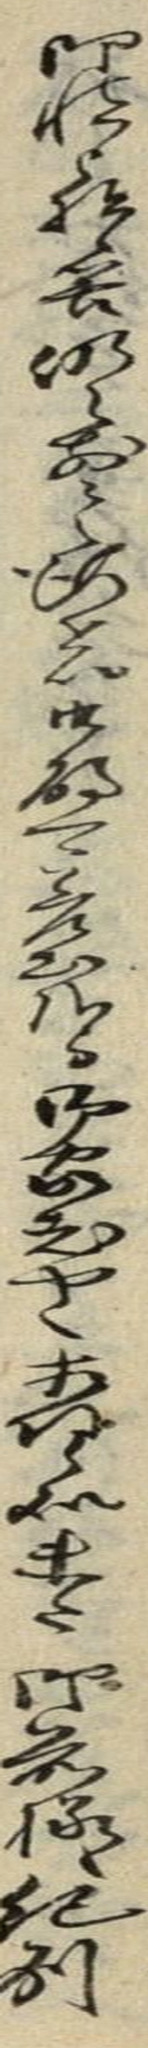御慎被遊候筈仍之前々之趣を以御触可差出哉と御家老中へ相伺候処未た御前様へ紀州
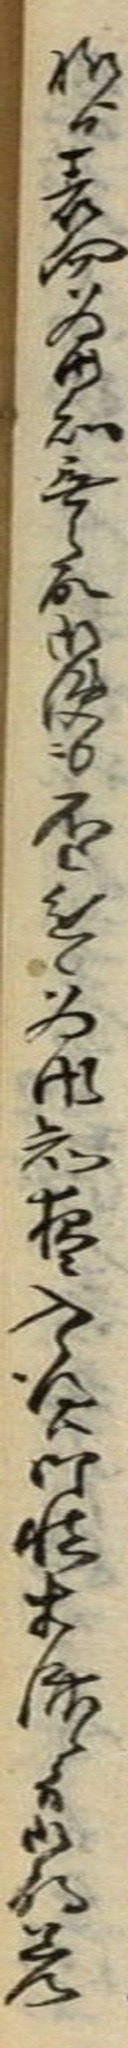様ゟ表向為御知無之故御使も不被進候為御知夜に入候得は御慎相済候に付御触差
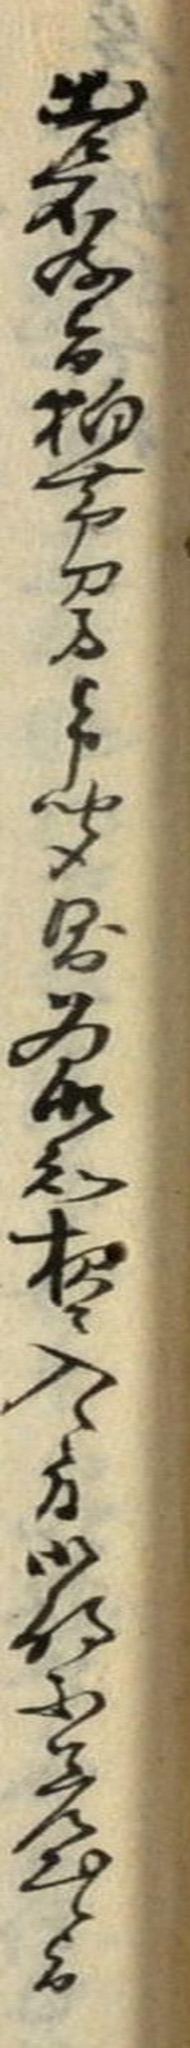出に不及旨狛帯刀方被申聞則為御知夜に入候に付御触不差出候旨
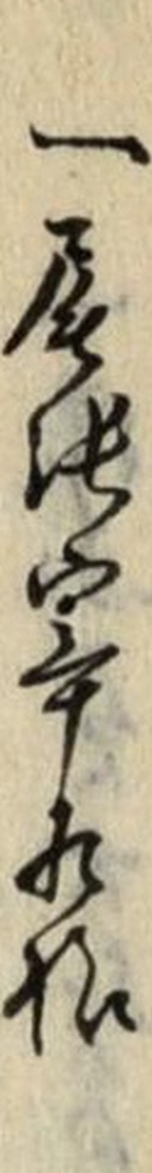一尾張中将様
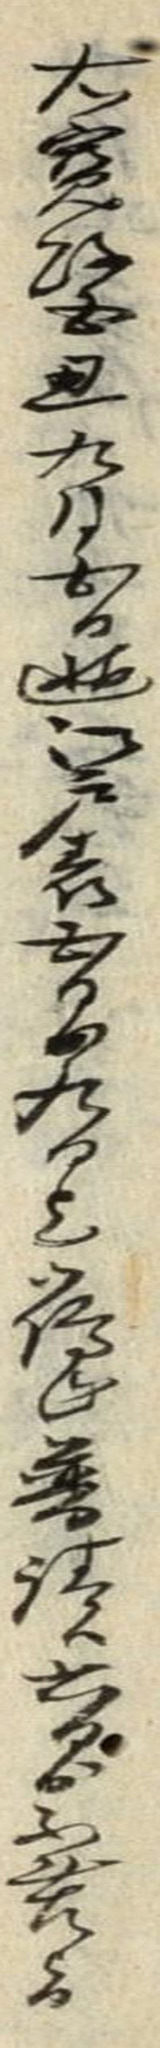右寛政五丑九月五日逝江戸表五日ゟ九日迄御停止普請は六日ゟ不苦旨
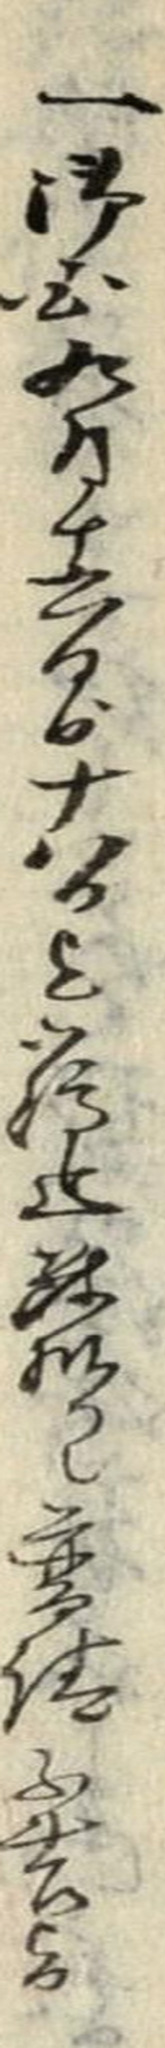一御国九月十六日ゟ十八日迄御停止致掛り候普請不苦旨
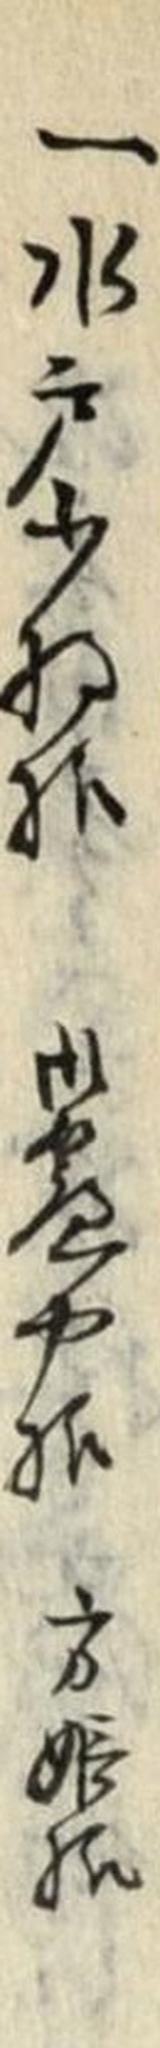一水戸少将様御簾中様方姫様
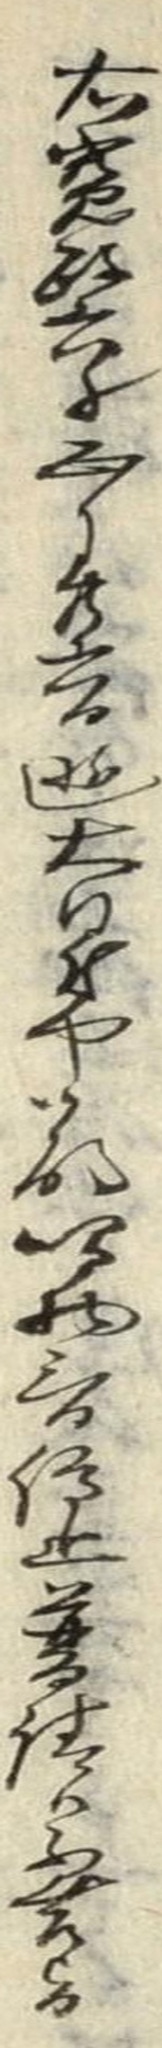右寛政六刁正月廿六日逝大目付中御触鳴物三日停止普請は不苦旨
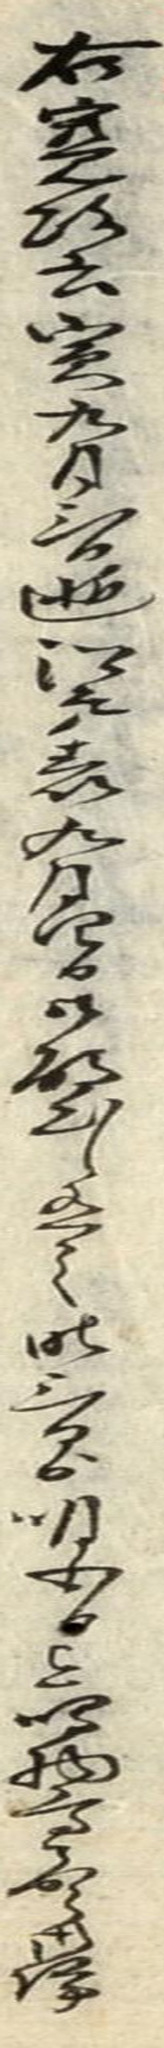右寛政六寅九月三日逝江戸表九月四日御触出し有之昨三日ゟ明五日迄鳴物高声御停
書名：御停止異変死失
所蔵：福井県文書館 Fukui Prefectural Archives
